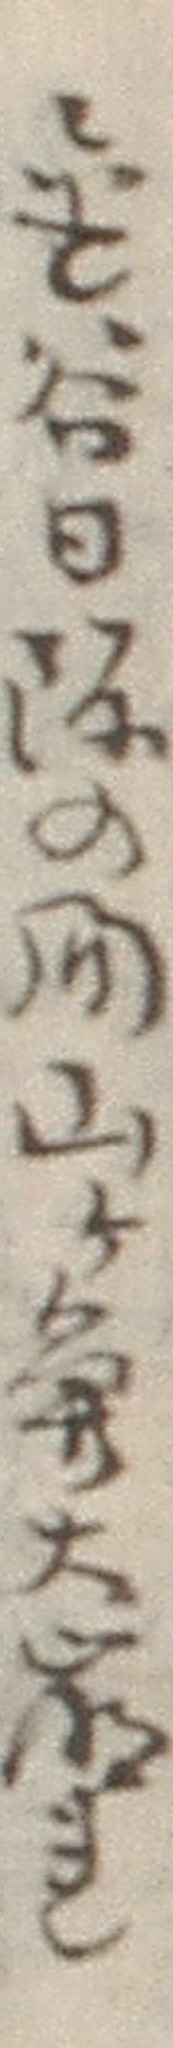金谷日坂の間山ケ鼻大崩れ
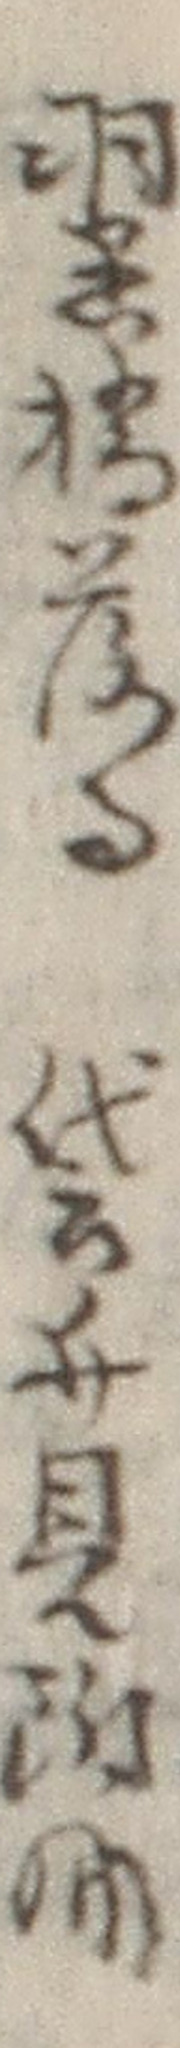羽黒橋落る袋井見附間
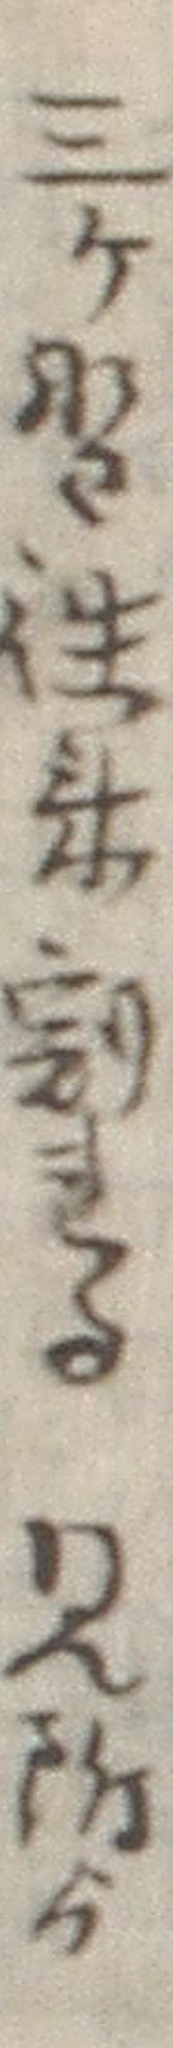三ケ野往来割れる見附ゟ
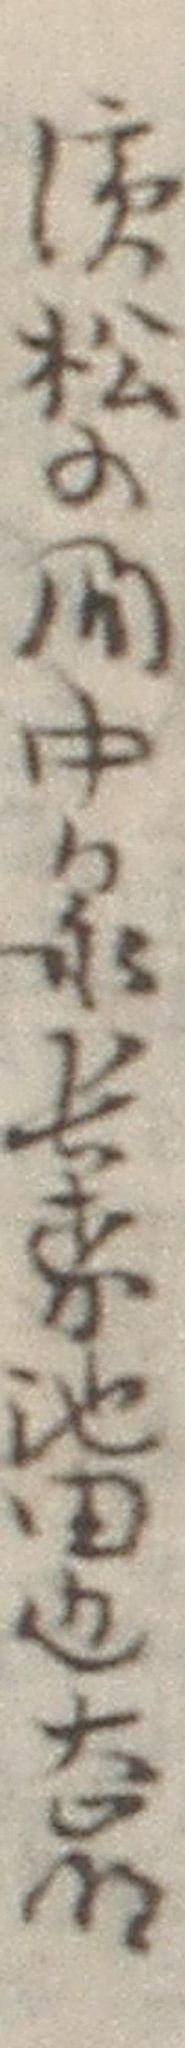濱松の間中泉長森池田辺大崩
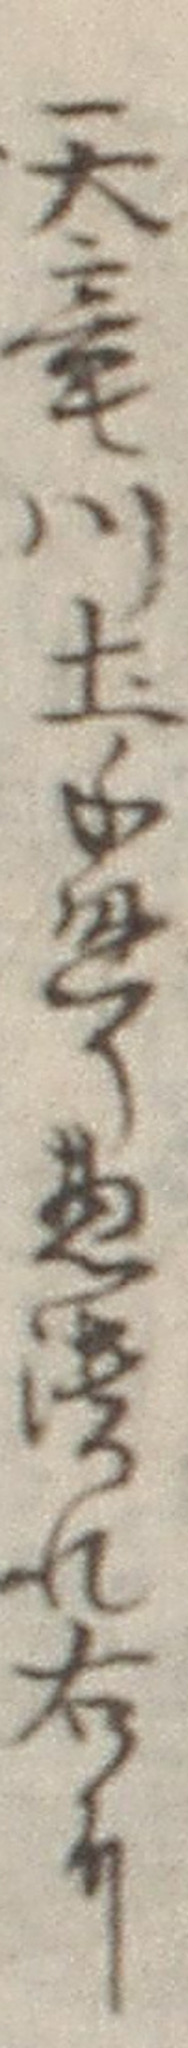天竜川土手廻り惣潰れ右に
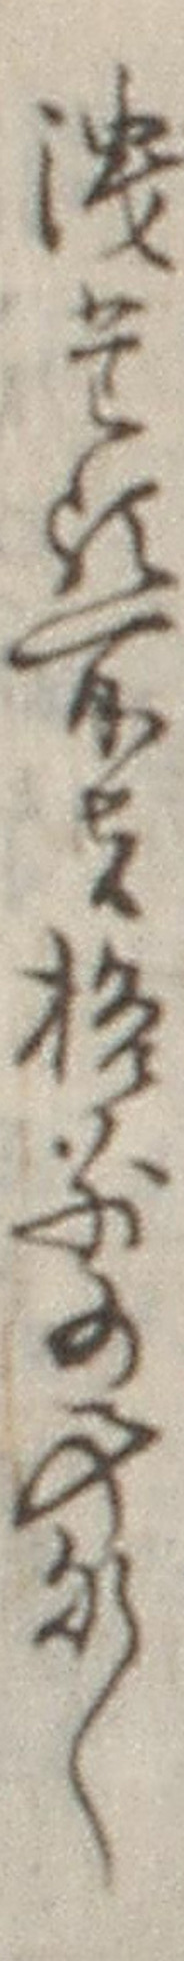洩たる所は格別の事なし

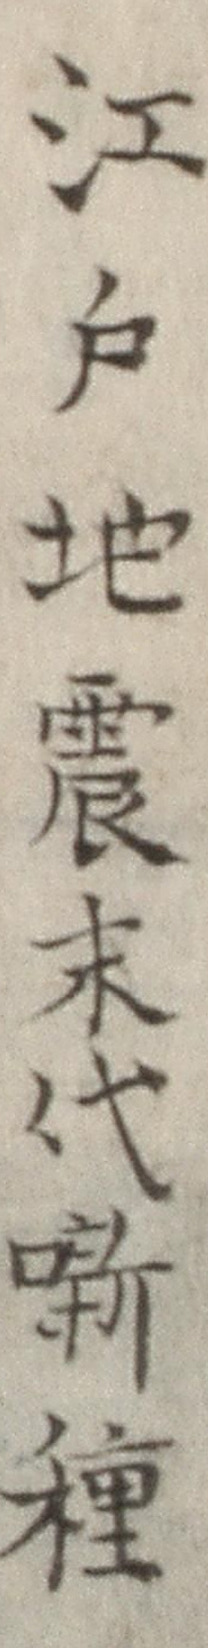江戸地震末代噺種
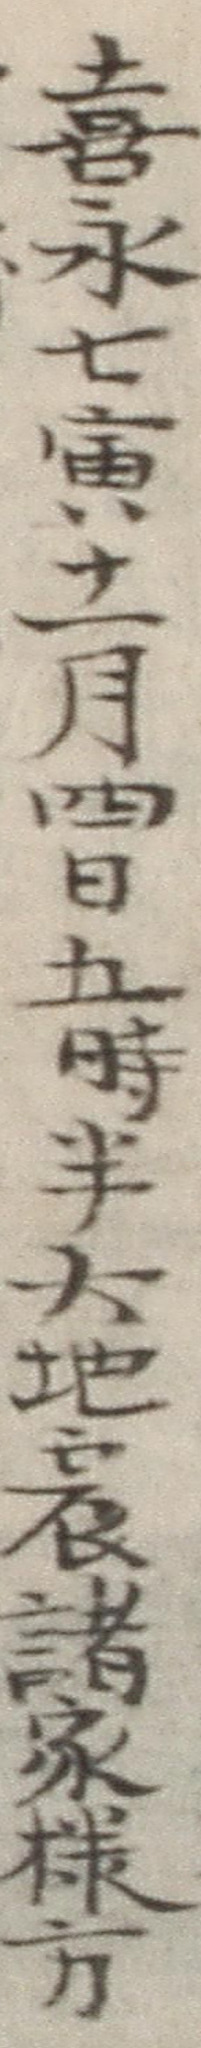嘉永七寅十一月四日五時半大地震諸家様方
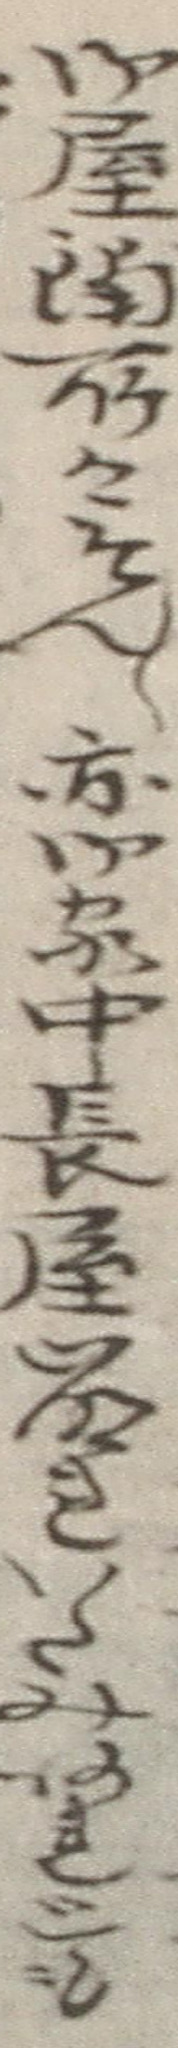御屋鋪所々そんじ亦御家中長屋崩れいたみあれとも
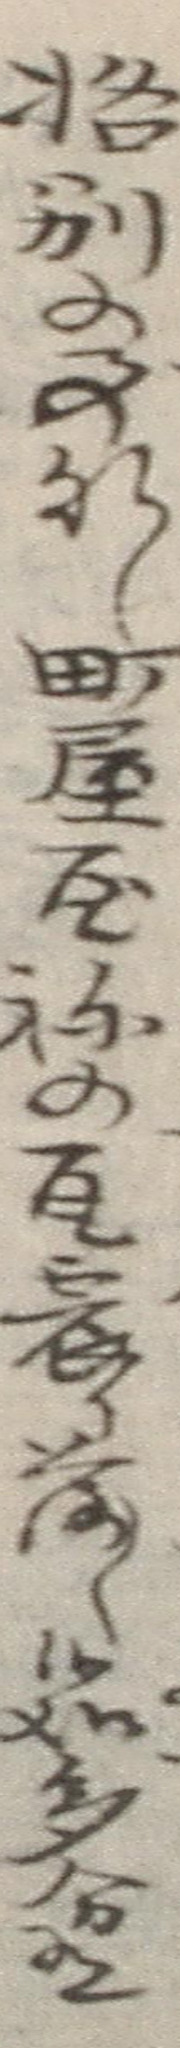格別の事なし町屋やねの瓦震り落し候処多分有
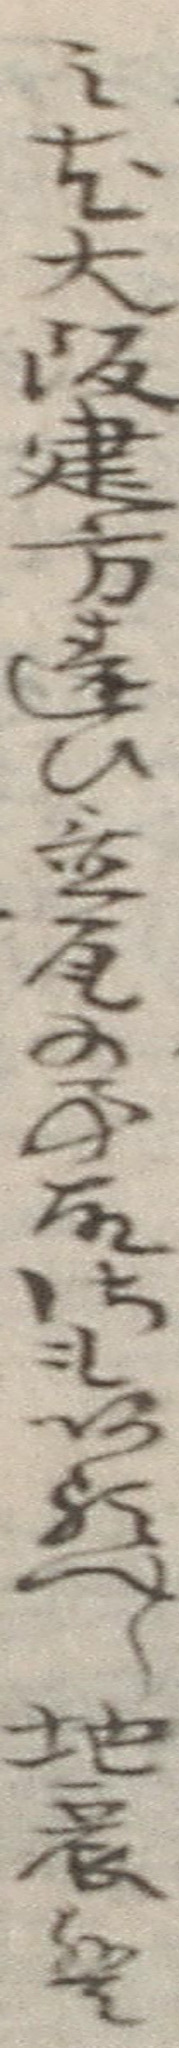之尤大阪建方違ひ置瓦の事故さもあるへし地震は
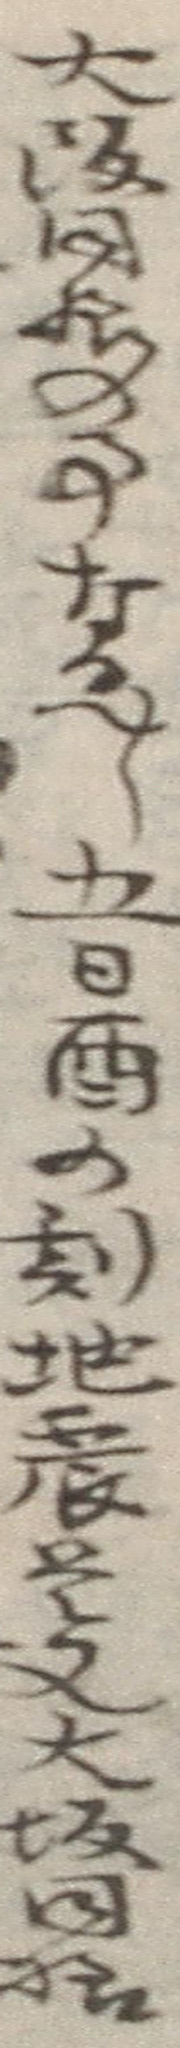大阪同様の事なるへし五日酉の刻地震是又大坂同様
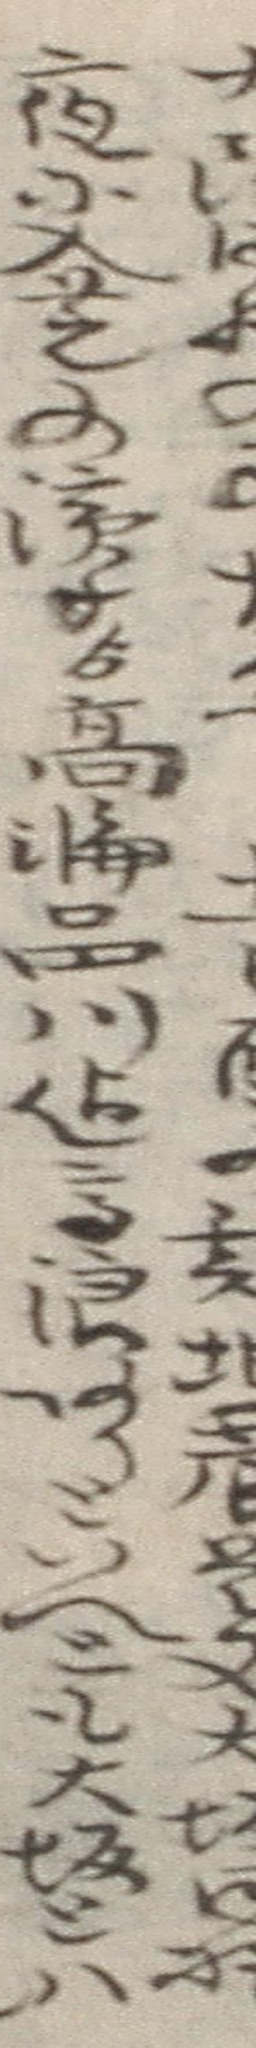夜に入芝の浜手ゟ高輪品川迠高浪ありといへとも大坂とは
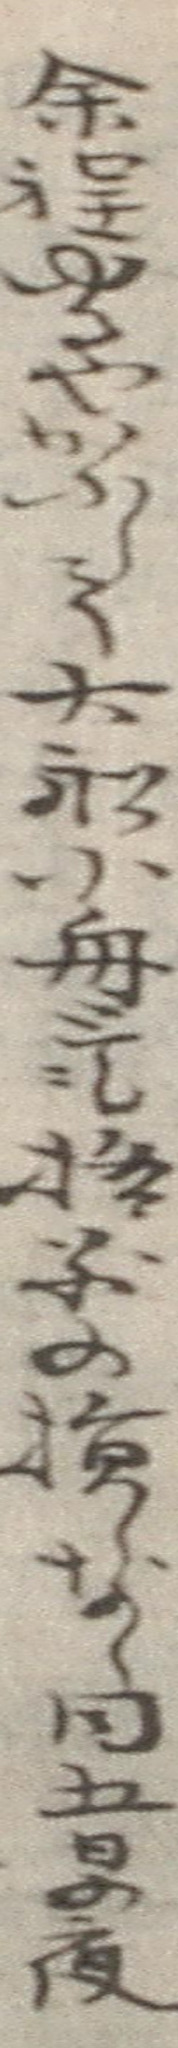余程ゆるやかにして大舩小舟とも格別の損しなし同五日の夜
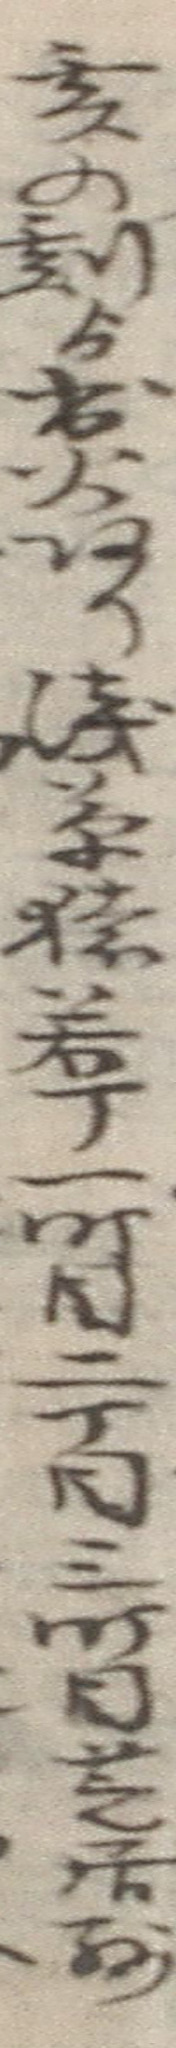亥の刻ゟ出火あり浅草猿若丁一町目二丁目三町目芝居残
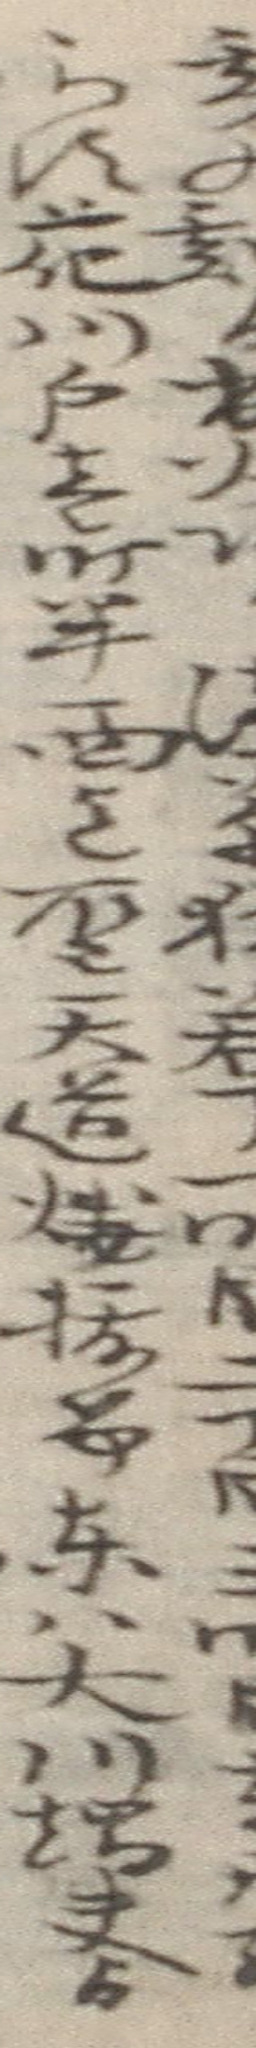らす花川戸壱町半西迄聖天道焼抜け東は大川端夫ゟ
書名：諸國大地震年代記末代噺種
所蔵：東京大学地震研究所図書室 Earthquake Research Institute Library, The University of Tokyo, JAPAN
